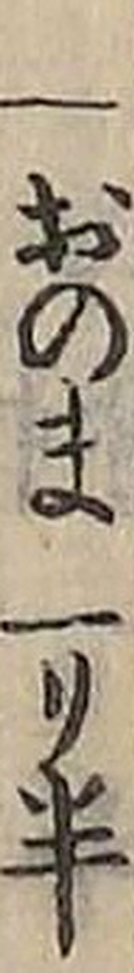おのま一リ半
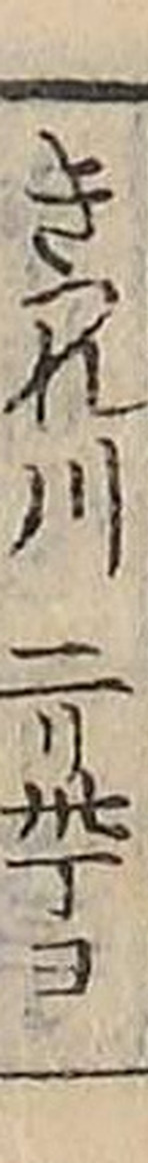きつれ川二リ卅丁ヨ
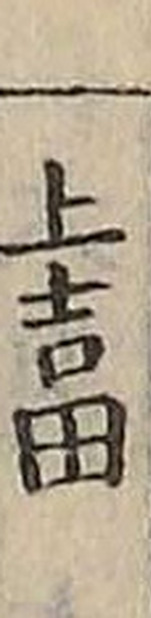上吉田
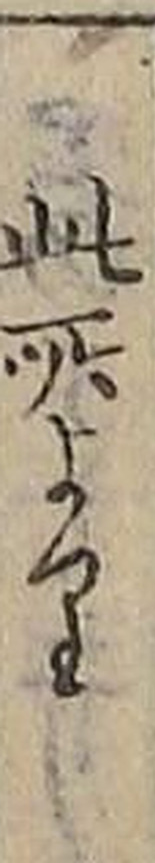此所より
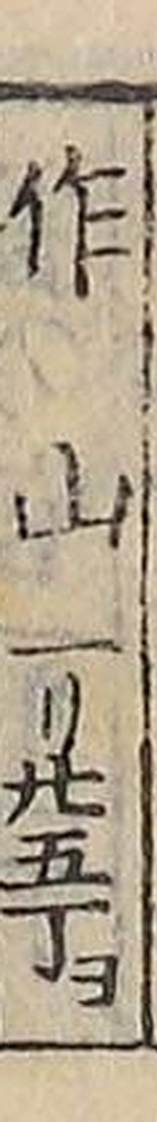作山一リ廿五丁ヨ
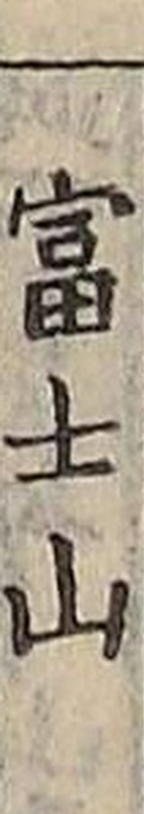富士山
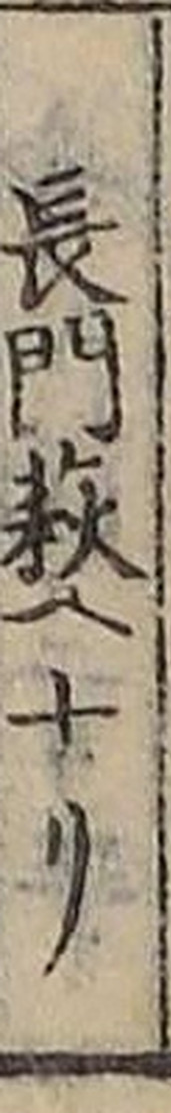長門萩へ十リ
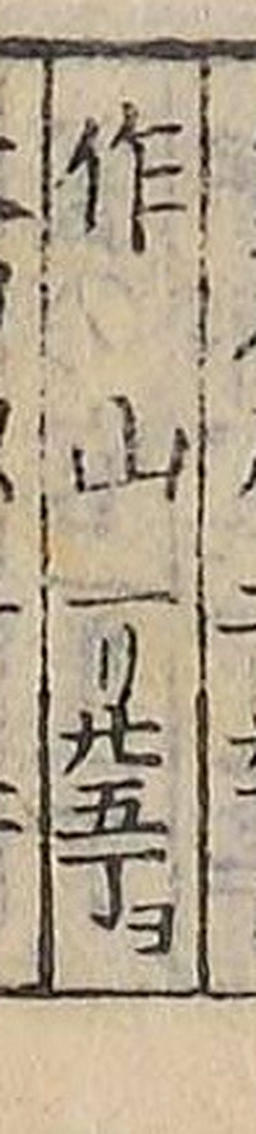作山一リ廿五丁ヨ
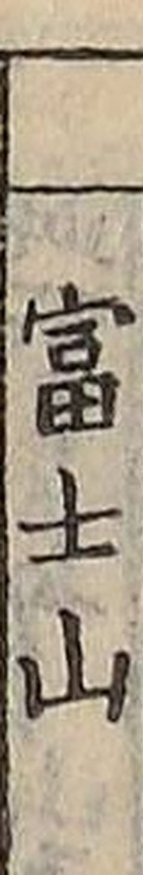富士山
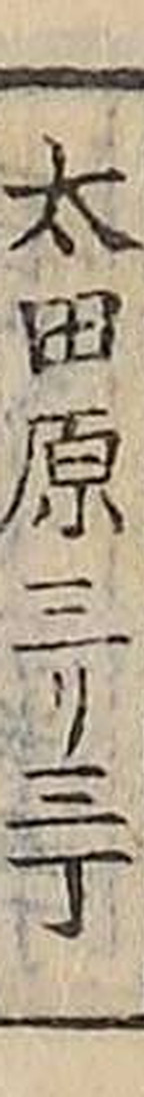太田原三リ三丁
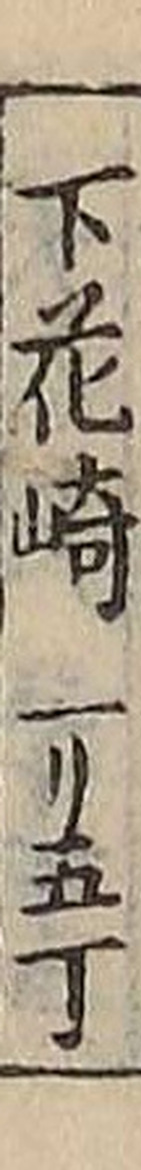下花崎一リ五丁
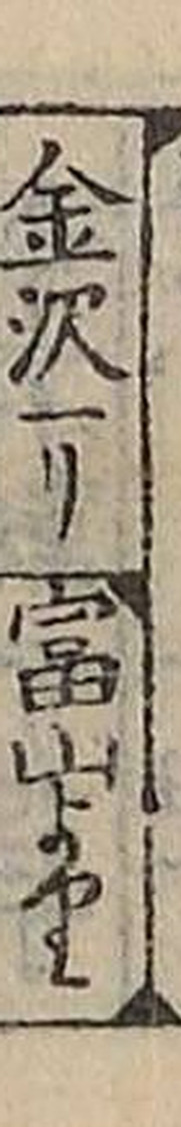金沢一リ富山より
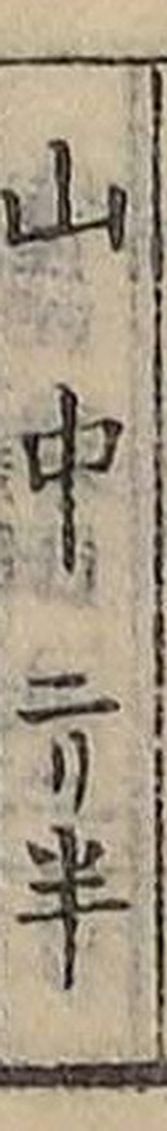山中二リ半
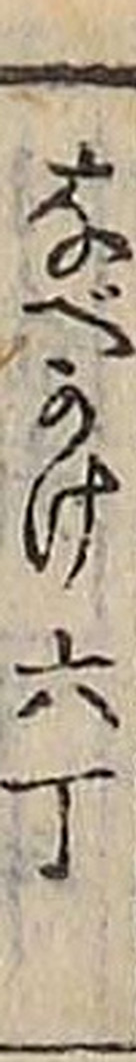なべかけ六丁
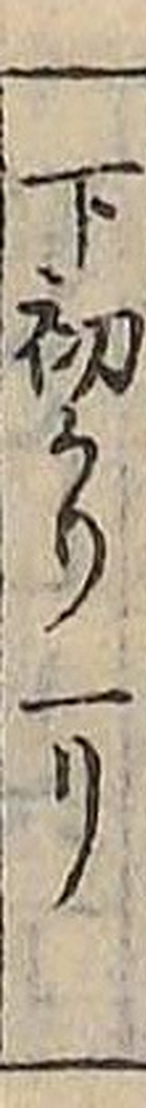下初かり一リ
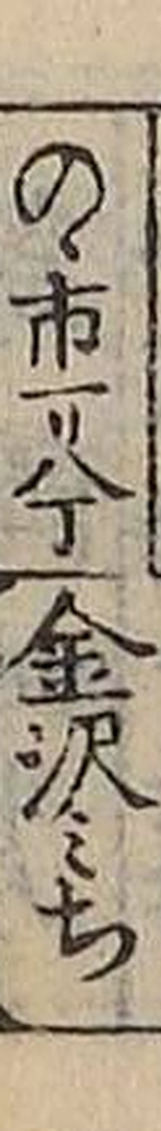のゝ市一リ八丁金沢みち
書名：旅行用心集
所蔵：神戸大学附属図書館 国文学研究資料館
